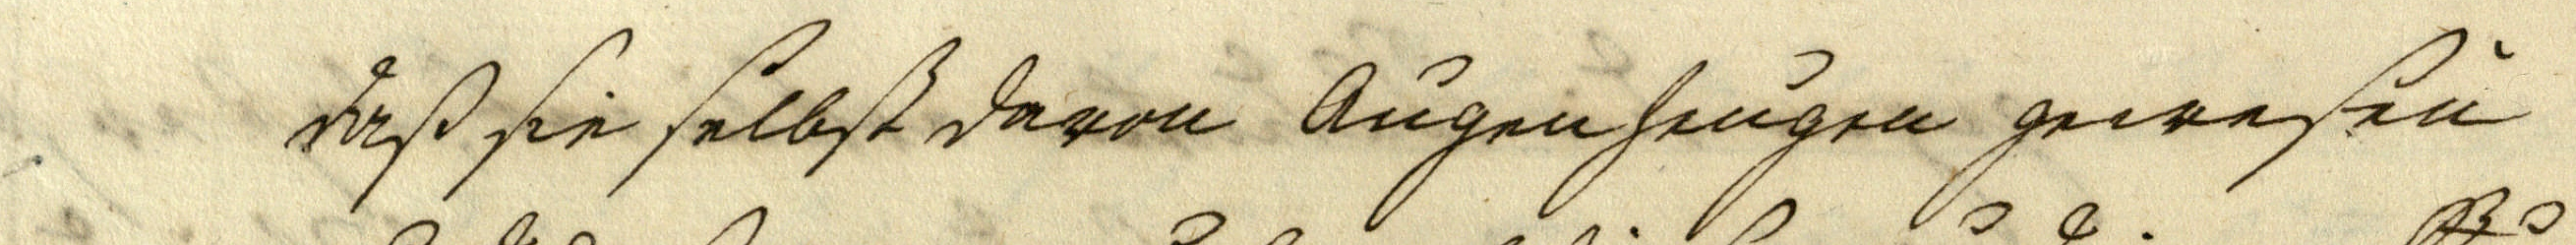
daß sie selbst davon Augenzeugen gewesen
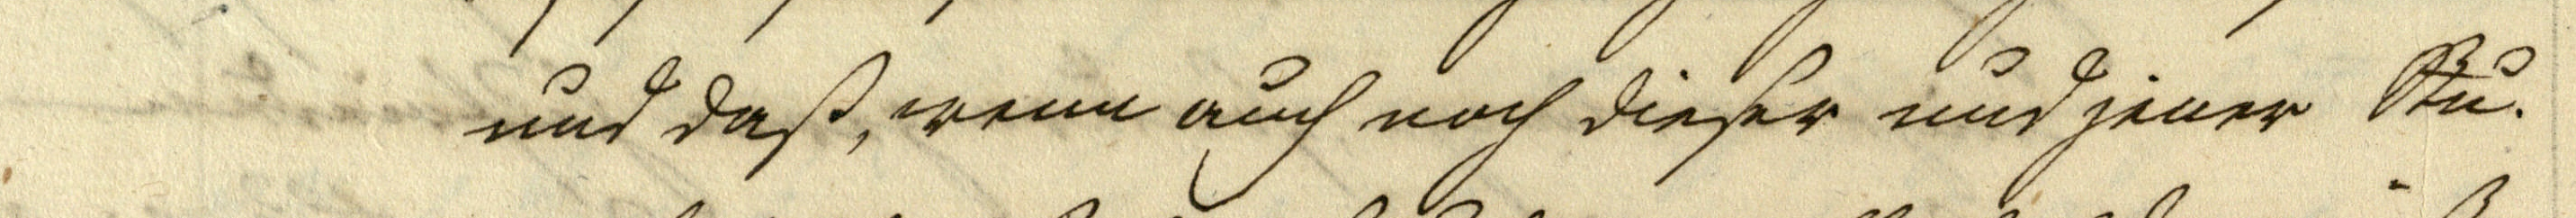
und daß, wenn auch noch dieser und jener Stu-
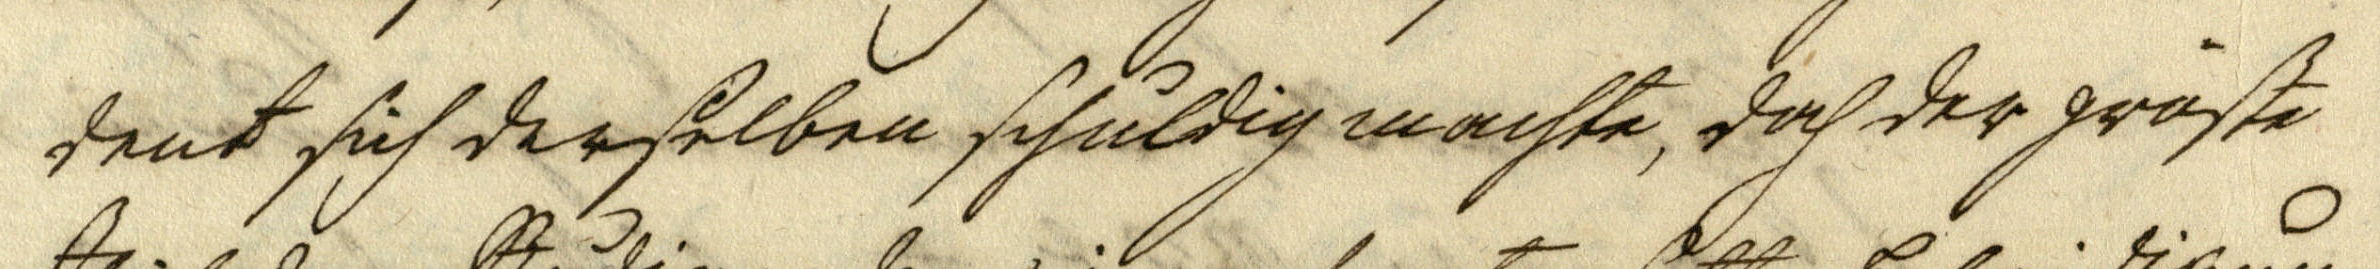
dent sich derselben schuldig machte, doch der größte
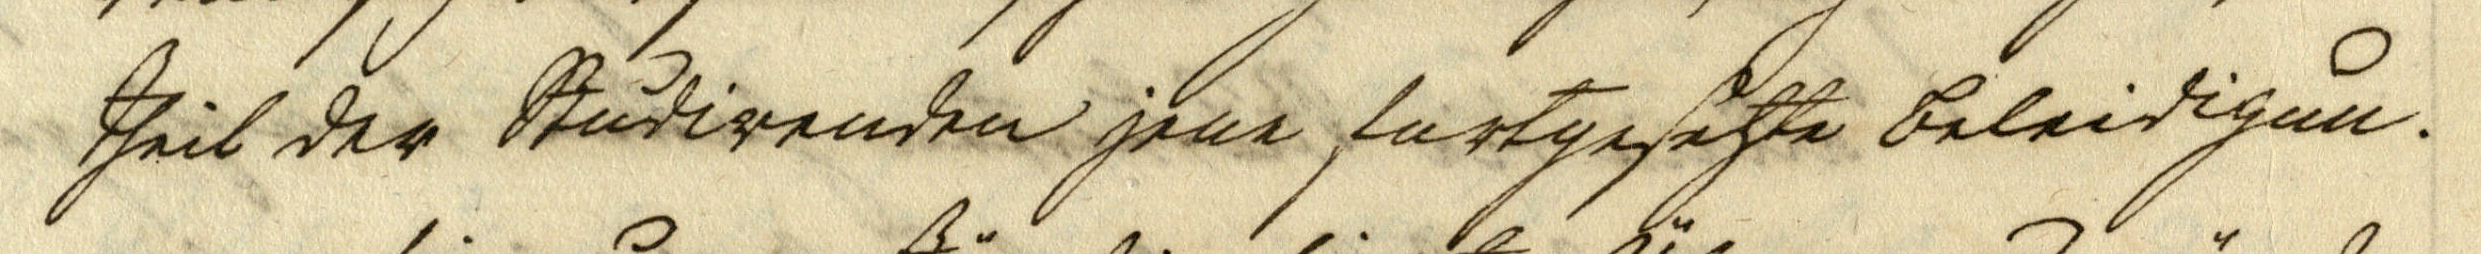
Theil der Studirenden jene fortgesetzte Beleidun-
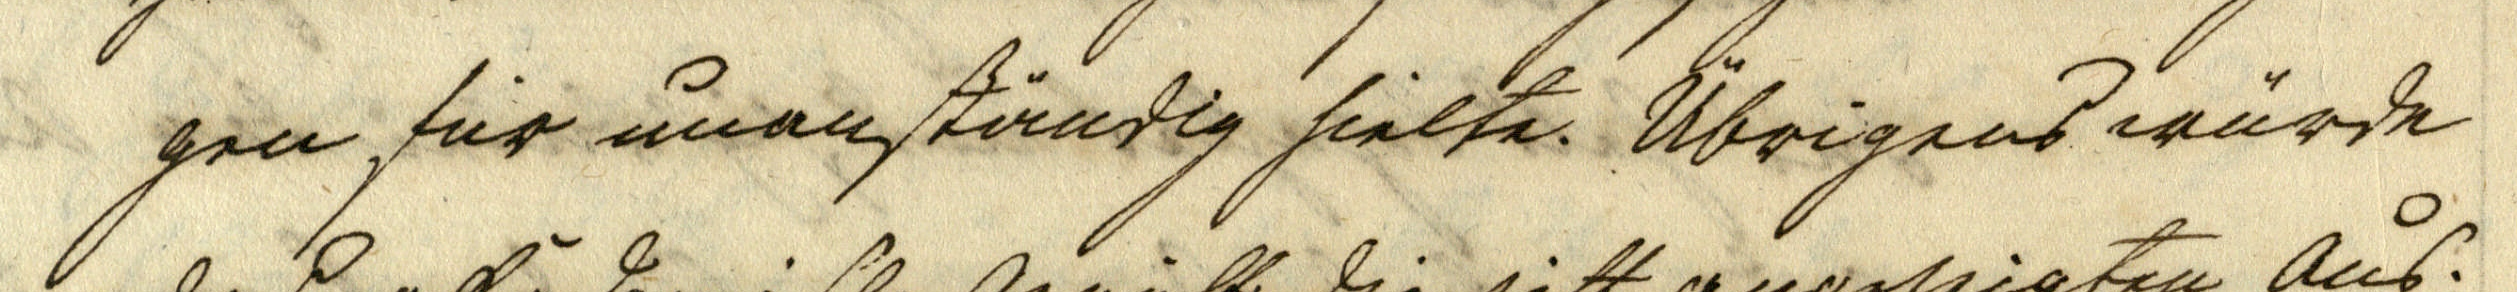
gen für unanständig hielte. Übrigens würde
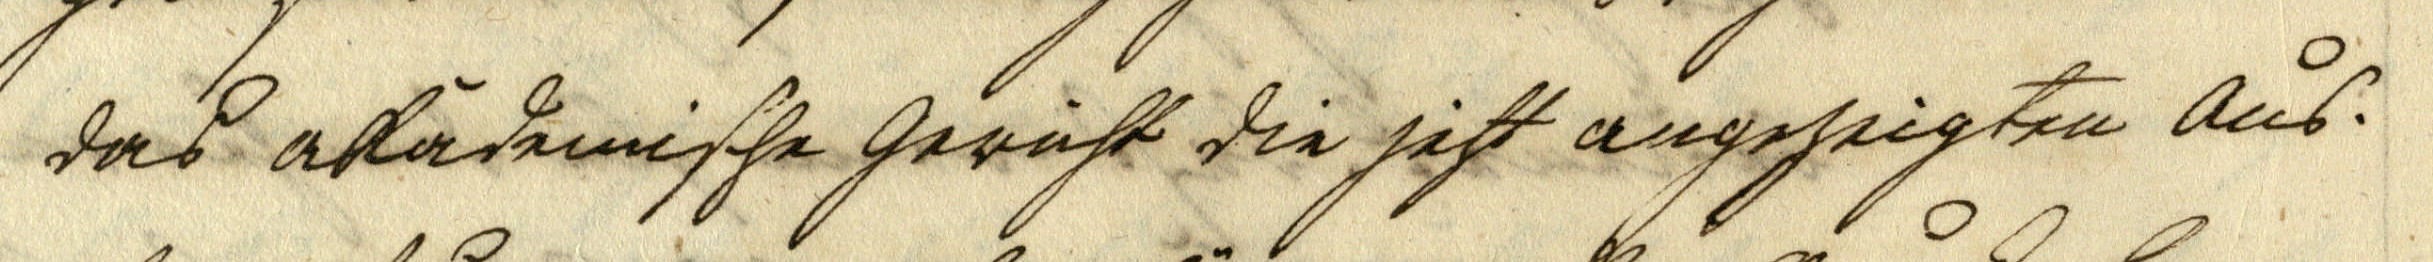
das akademische Gericht die jetzt angezeigten Aus-
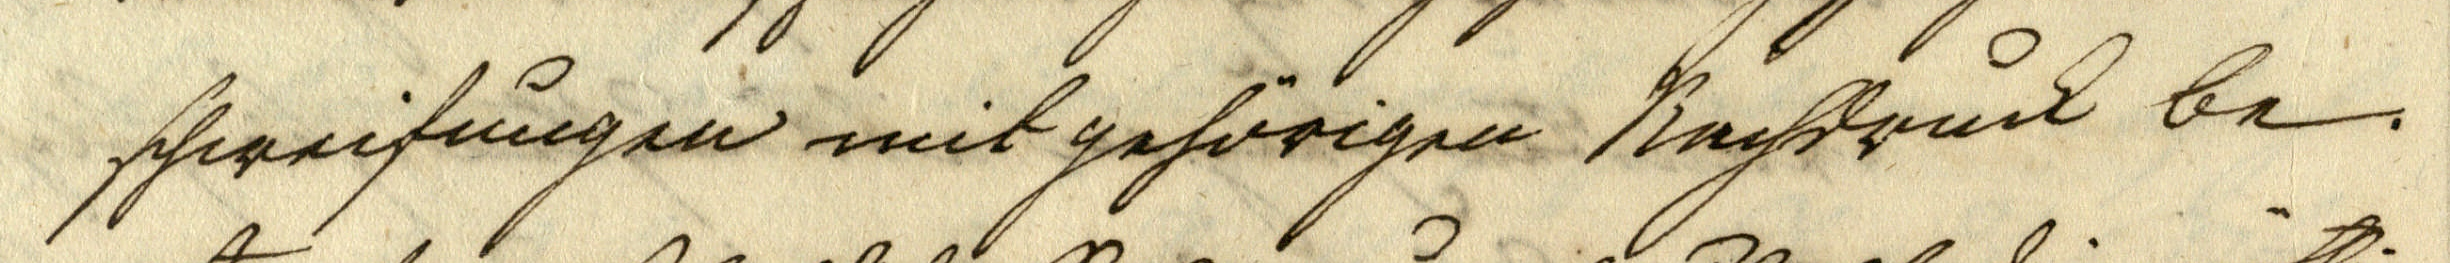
schweifungen mit gehörigen Nachdruck be-
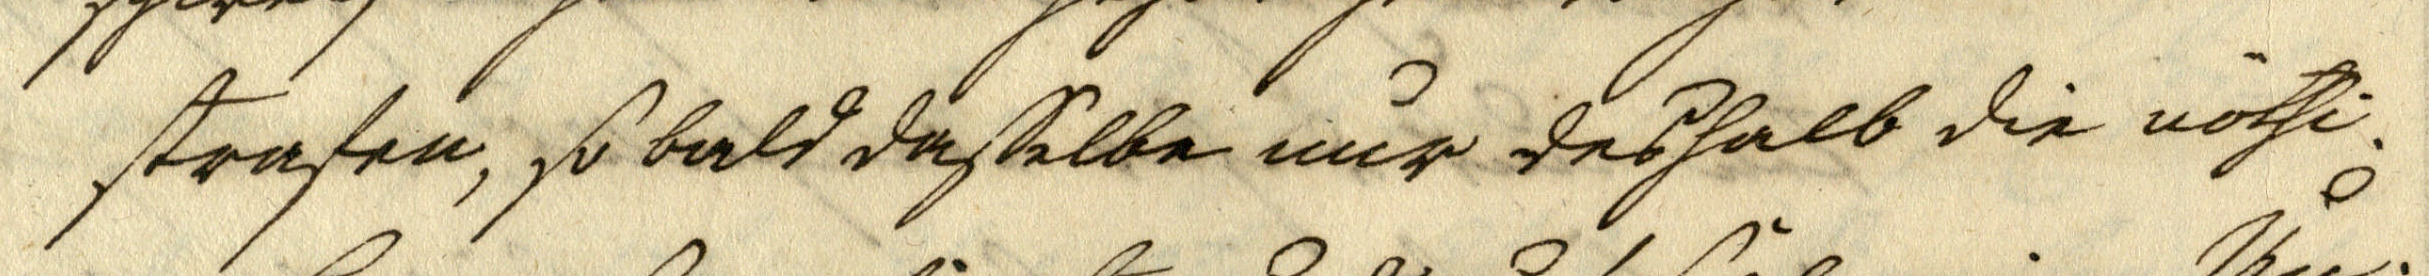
strafen, so bald dasselbe nur deshalb die nöthi-
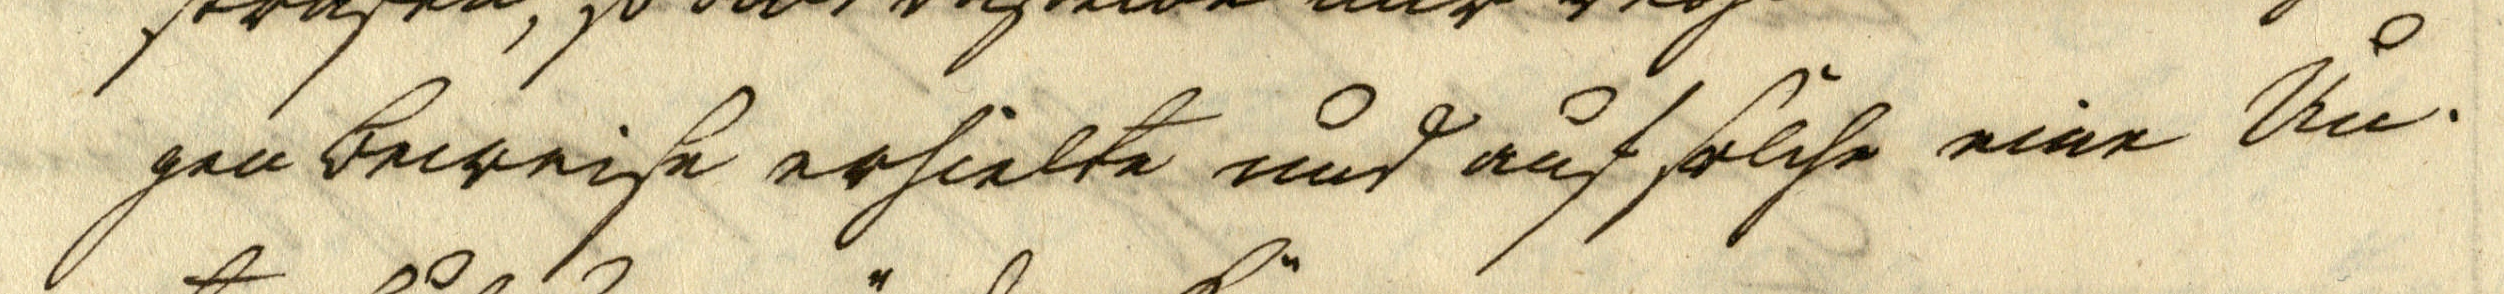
gen Beweise erhielte und auf solche eine Un-
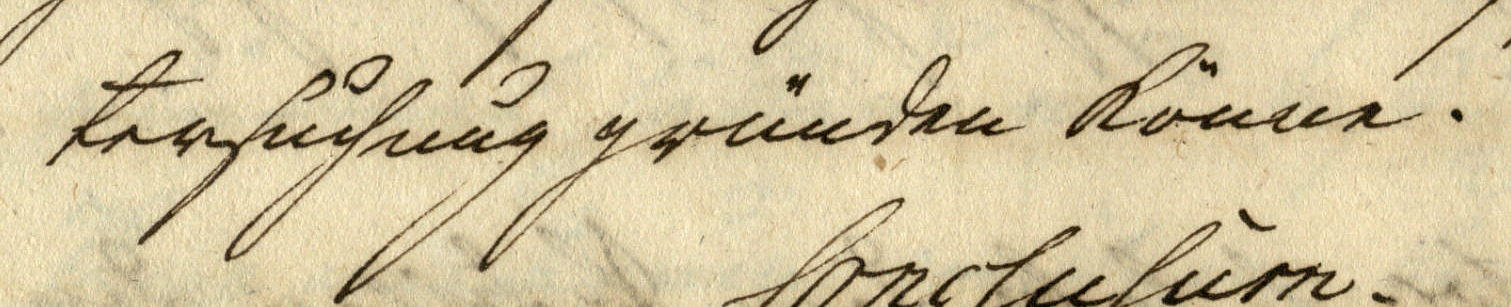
tersuchung gründen könne.
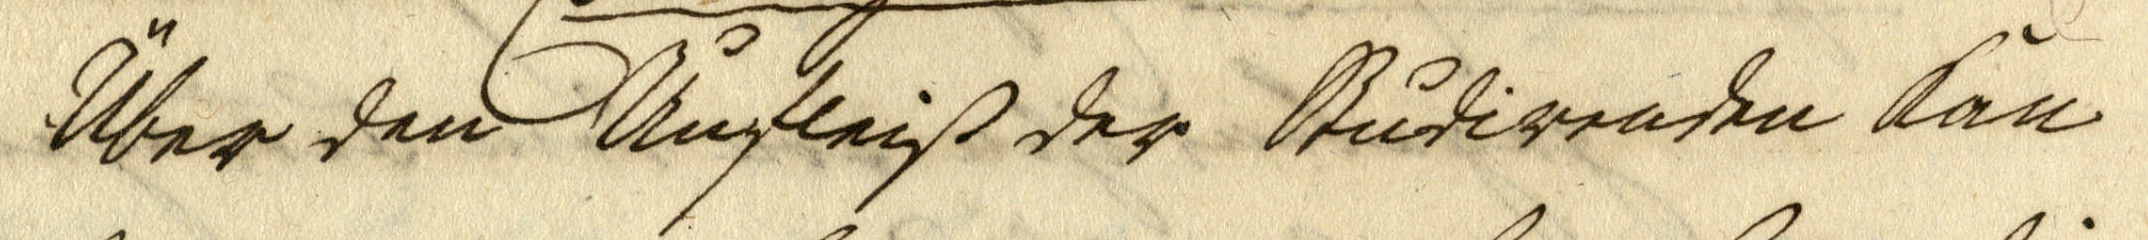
Über den Unfleiß der Studirenden kan
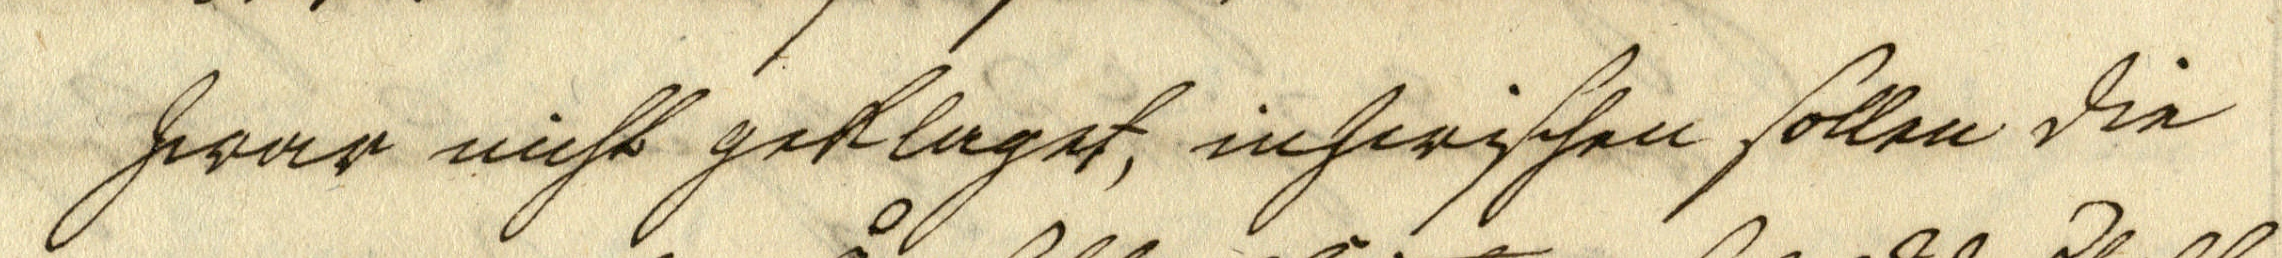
zwar nicht geklaget, inzwischen sollen die
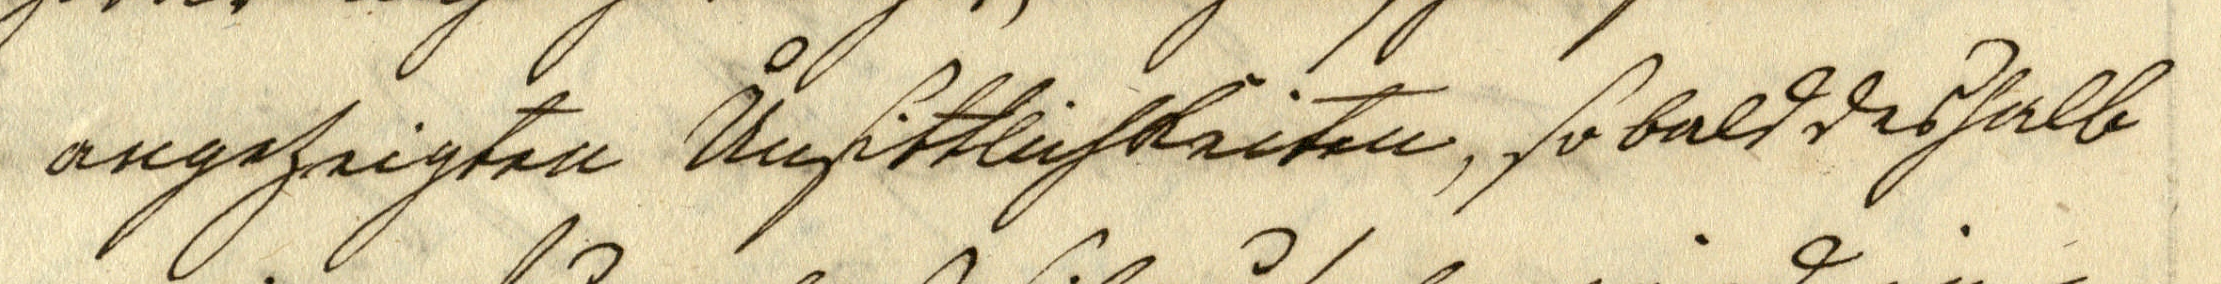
angezeigten Unsittlichkeiten, so bald deshalb
